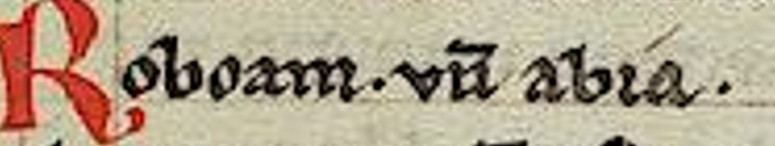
*Roboam. vn(d) abia.
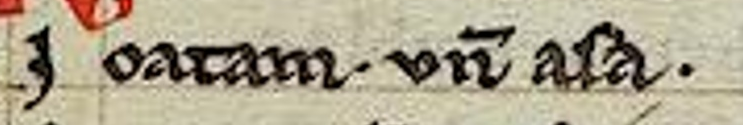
Joatam. vn(d) aſa.
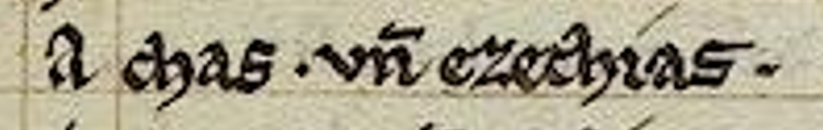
Achas. vn(d) ezechias.
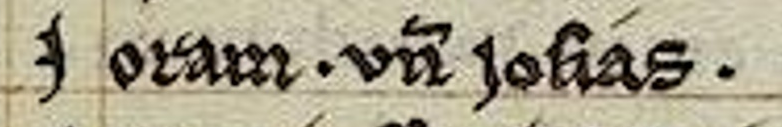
Joram. vn(d) joſias.
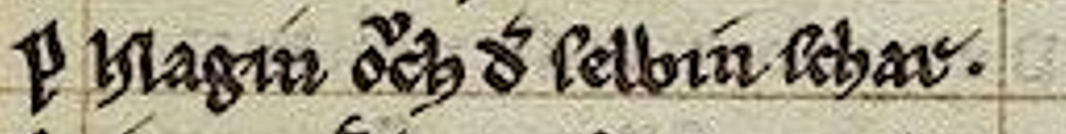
Phlagin o°vch d(er) ſelbin ſchar.
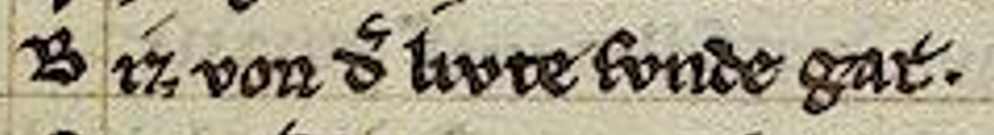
Biz von d(er) livte ſvnde gar.
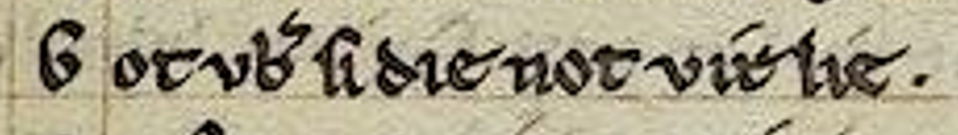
Got vb(er) ſi die not vir lie.
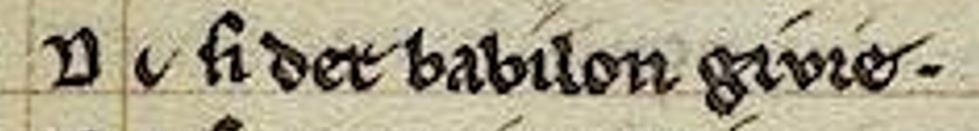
D(az) ſi der babilon givie.
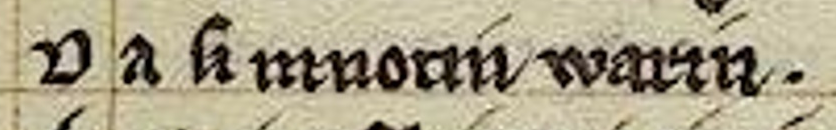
Da ſi innotin warin.
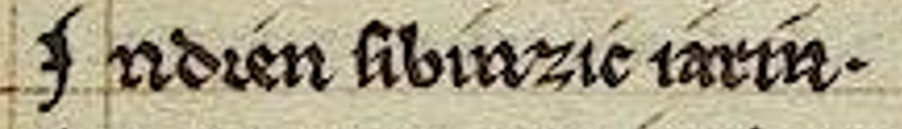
Indien ſibinzic iarin.
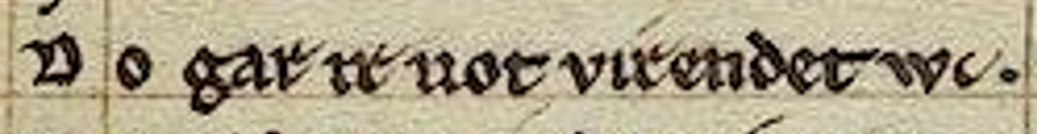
Do gar ir not virendet w(az).
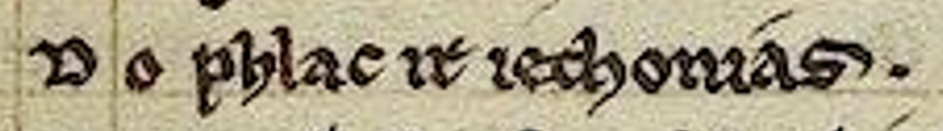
Do phlac ir iechonias.
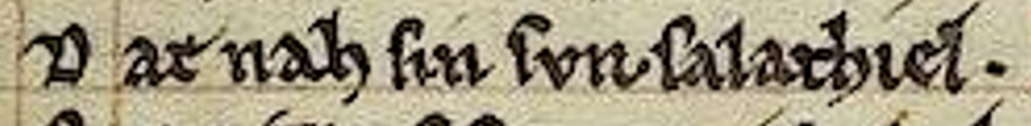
Dar nah ſin ſvn. ſalathiel.
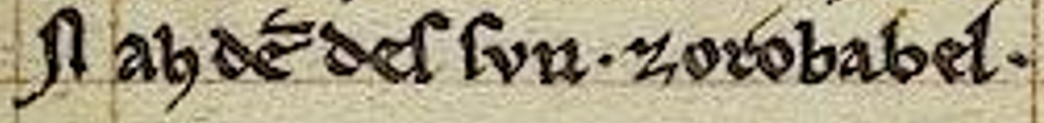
Nah de(m) deſ ſvn. zorobabel.
